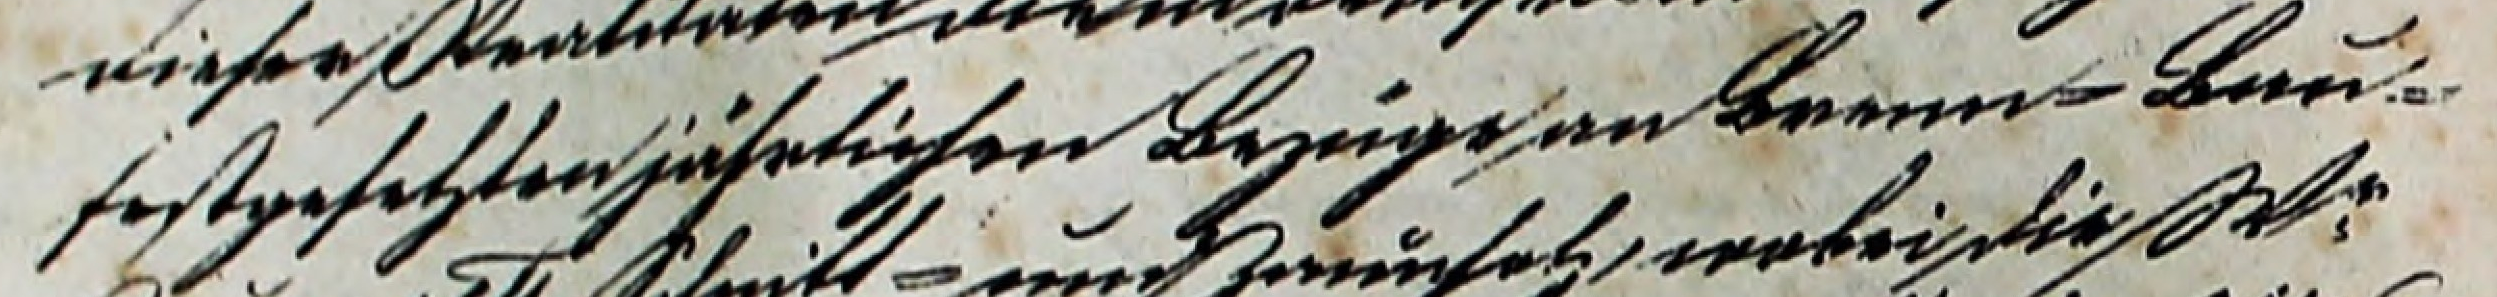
festgesetzten jährlichen Bezüge an Brenn= Bau=
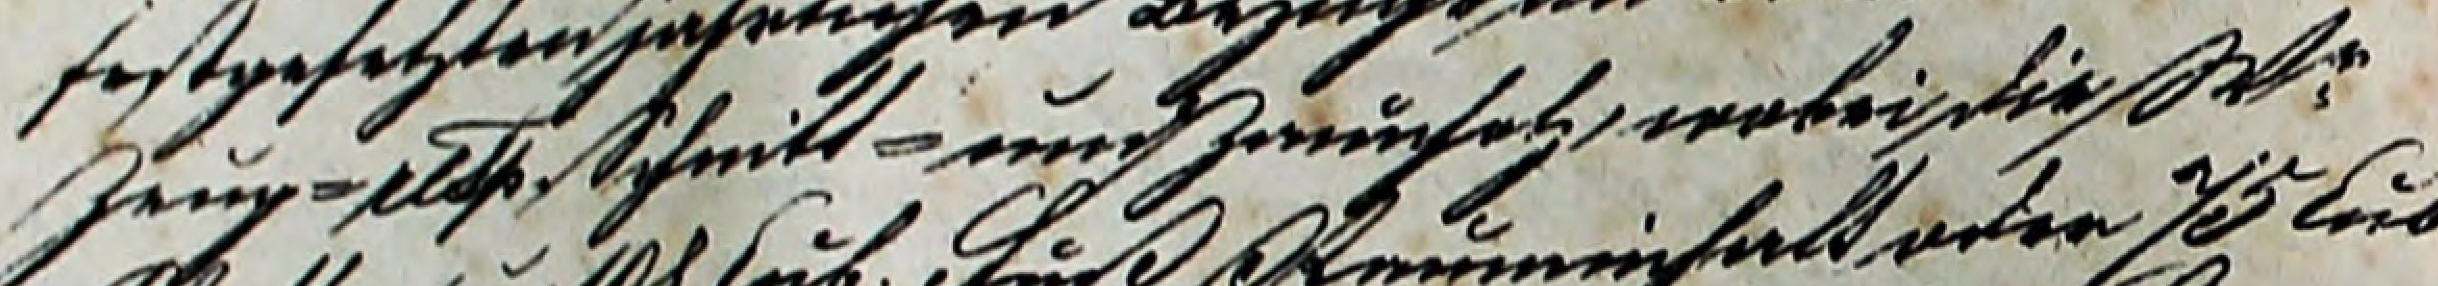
Zeug= Resp. Schnitt = und Zaunholz, wobei die Wr
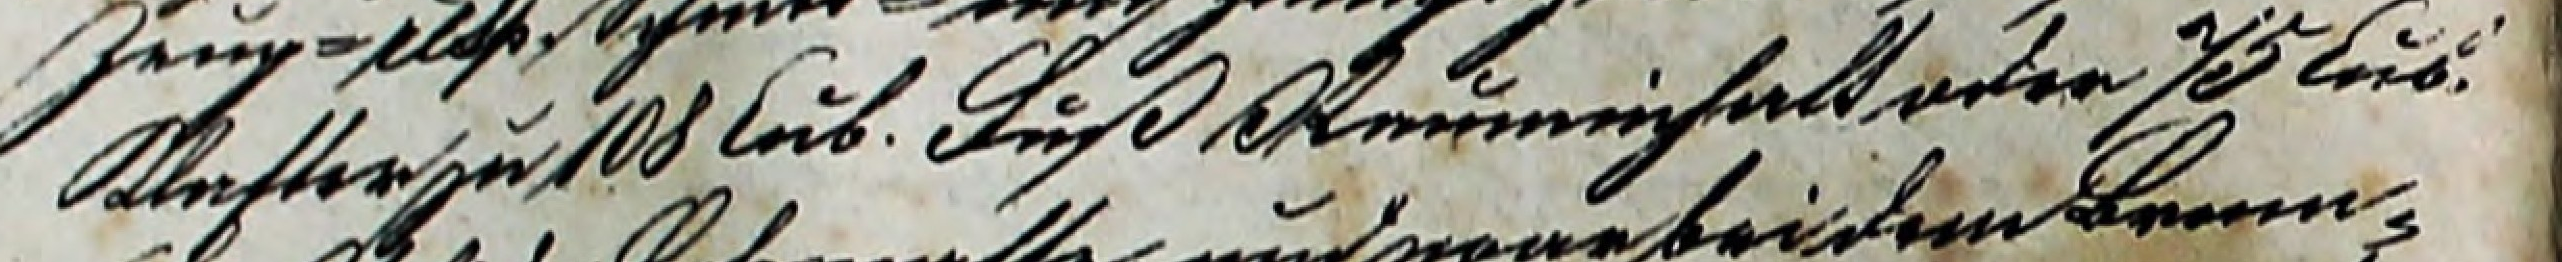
Blatter zu 108 Cub. Suß Raumichalt oder 75 Cus,
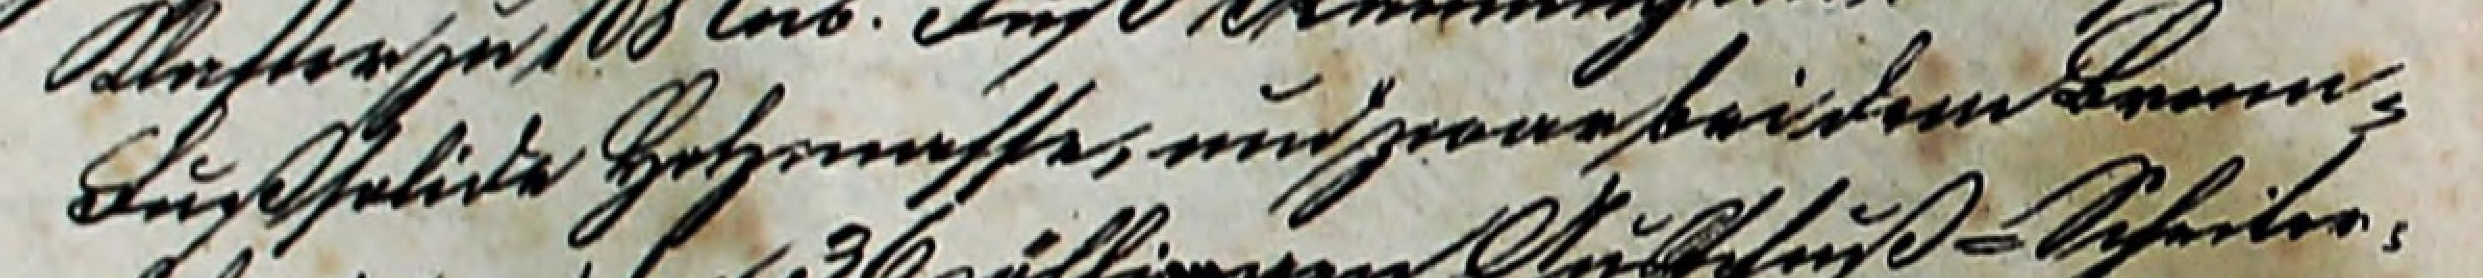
Sußsolide Holzmesse, und zwar bei dem Brenn„
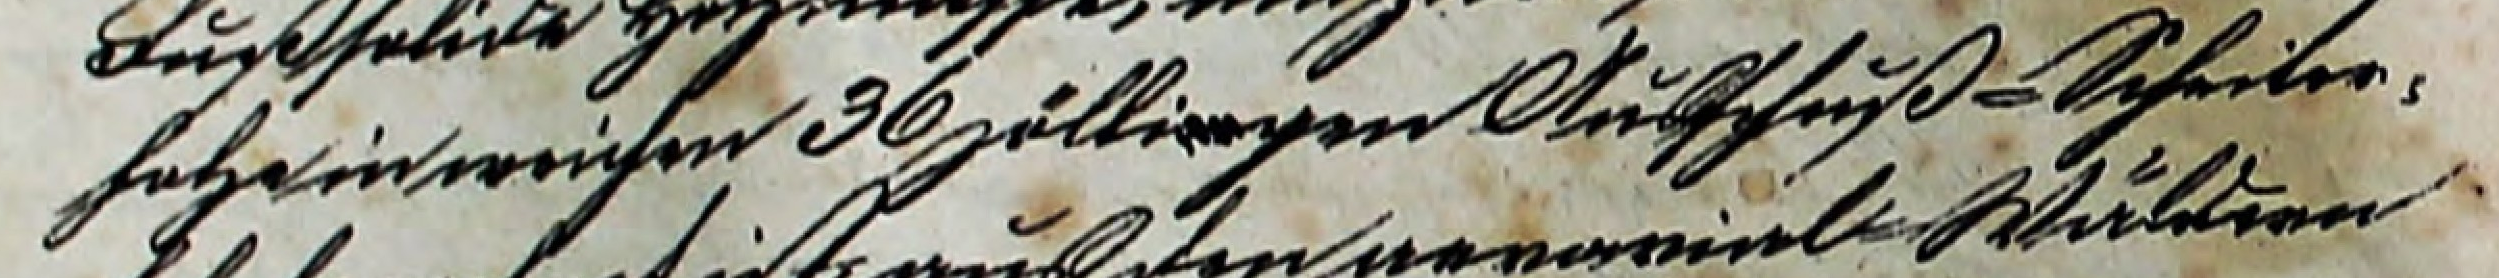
holze in weichen 36 zölligen August=Scheiter„
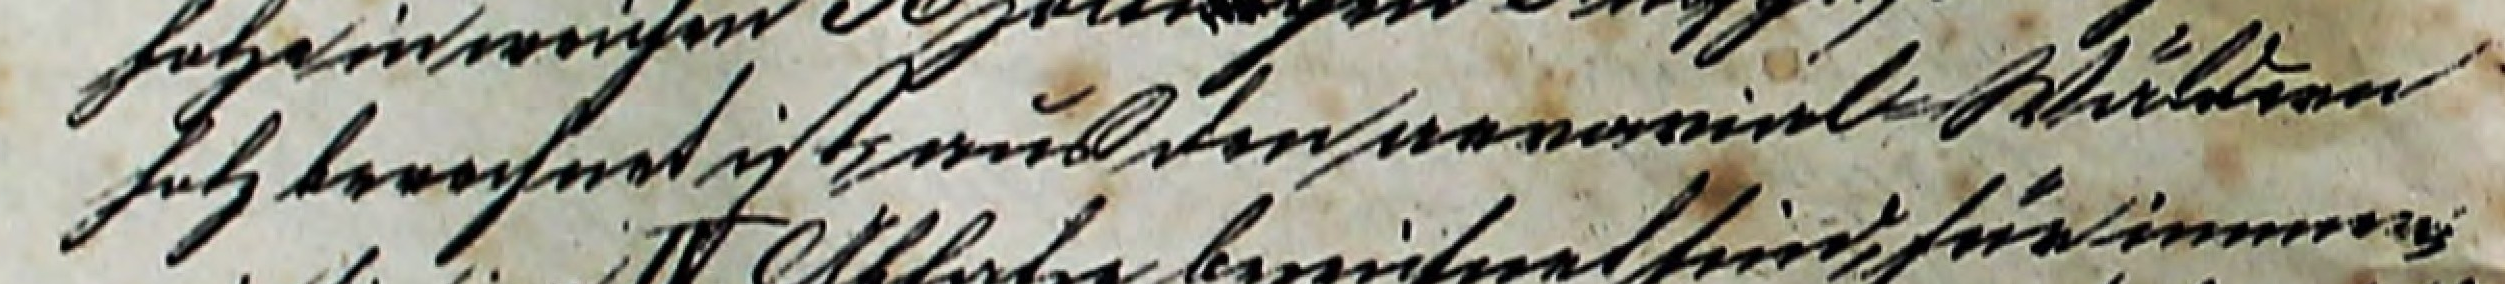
holz berechnet ist aus den anvarial = Wäldren
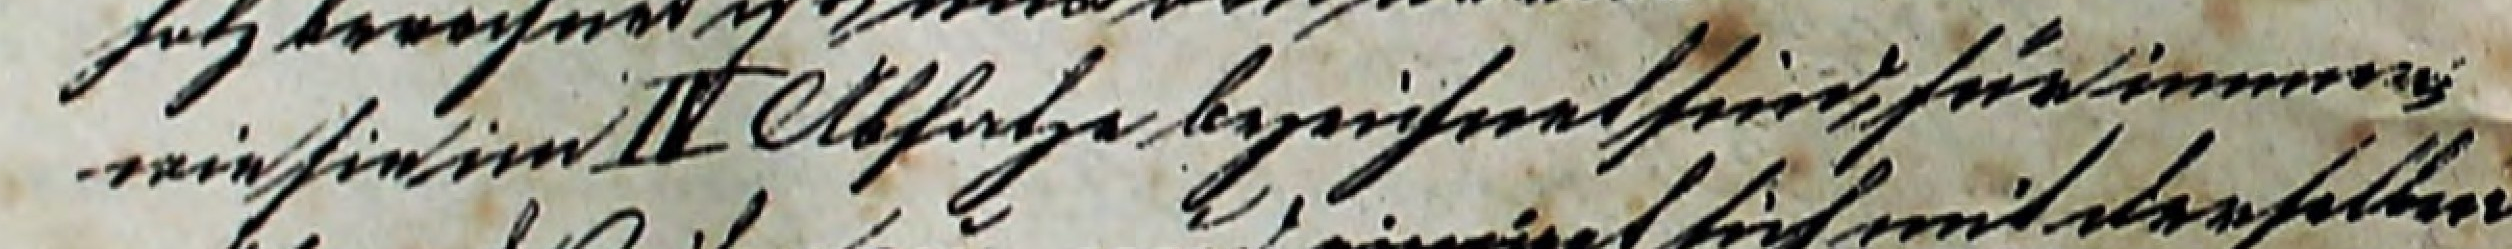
wie sie im IV Absatze bezeichnet sind, für immer
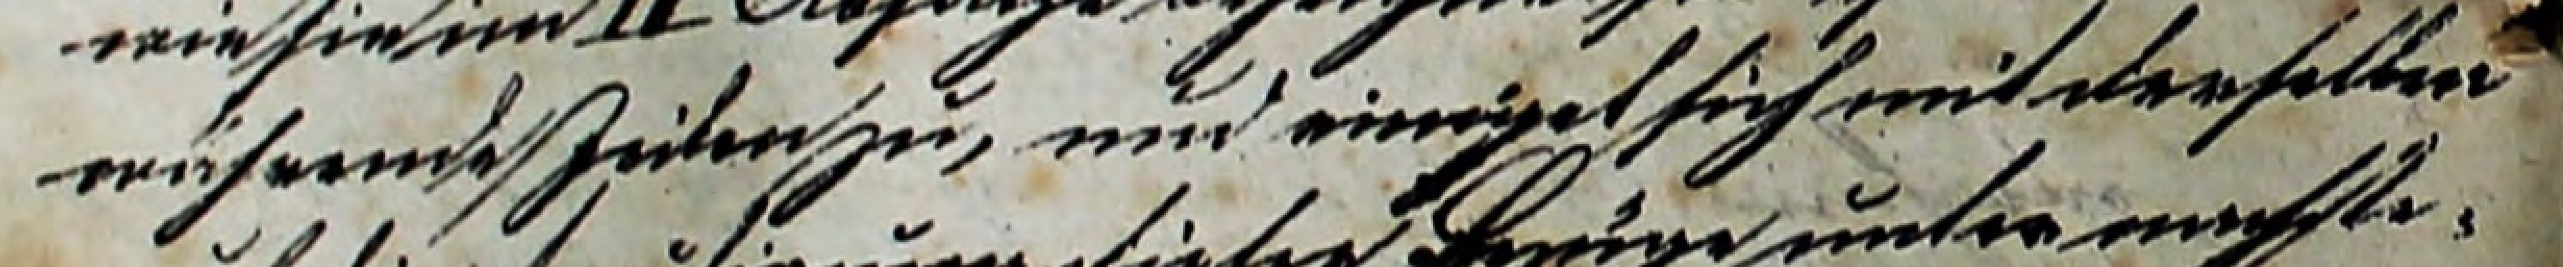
mährende Zeiten zu, und einiget sich mit derselben
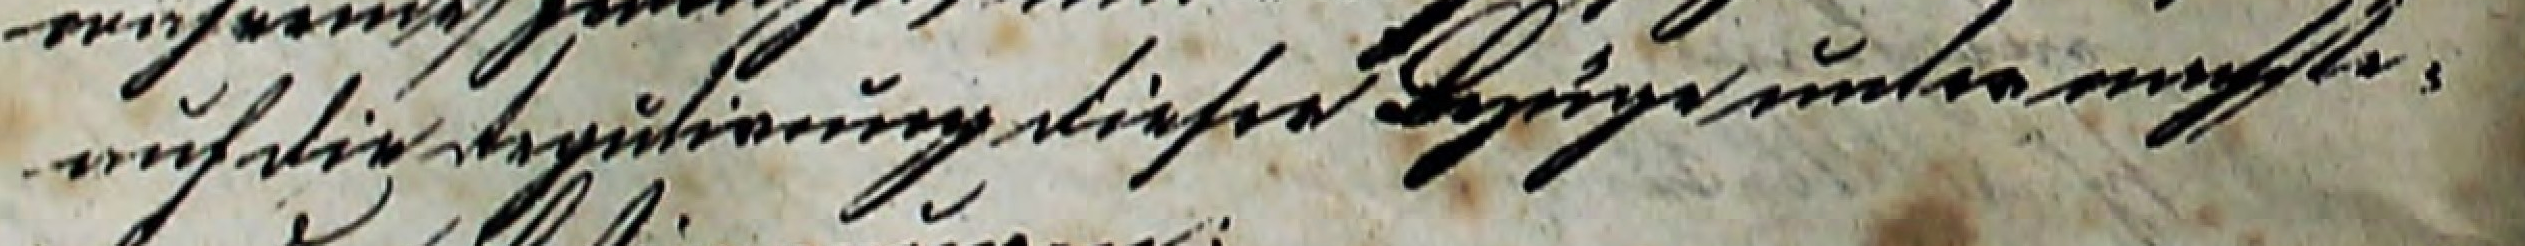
auf die Regulirung dieser Bezüge unter nachste„
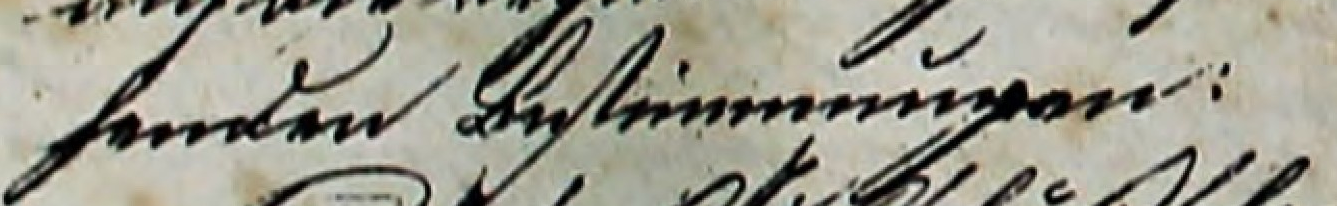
henden Bestimmungen.
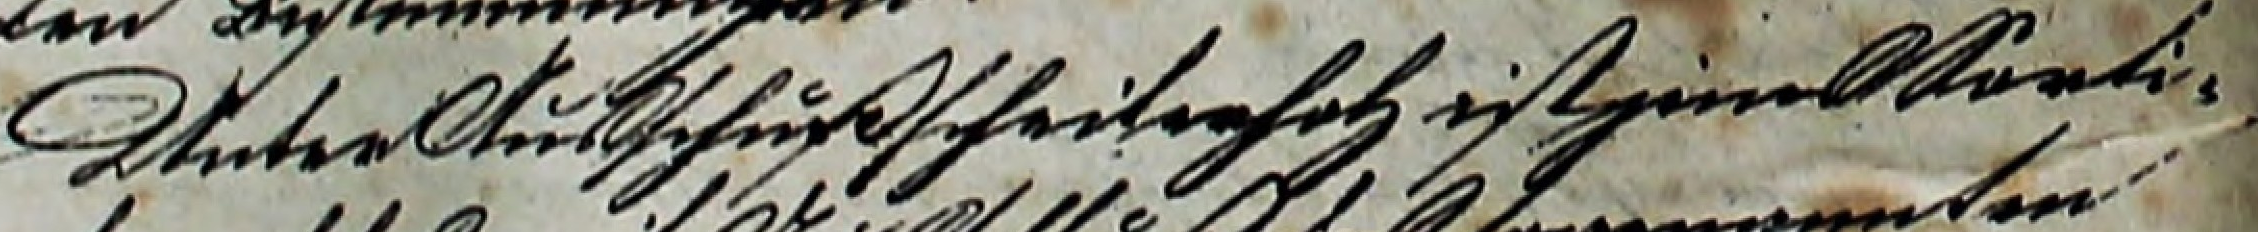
Unter Ausschuß scheiterholz istzines Sorti„
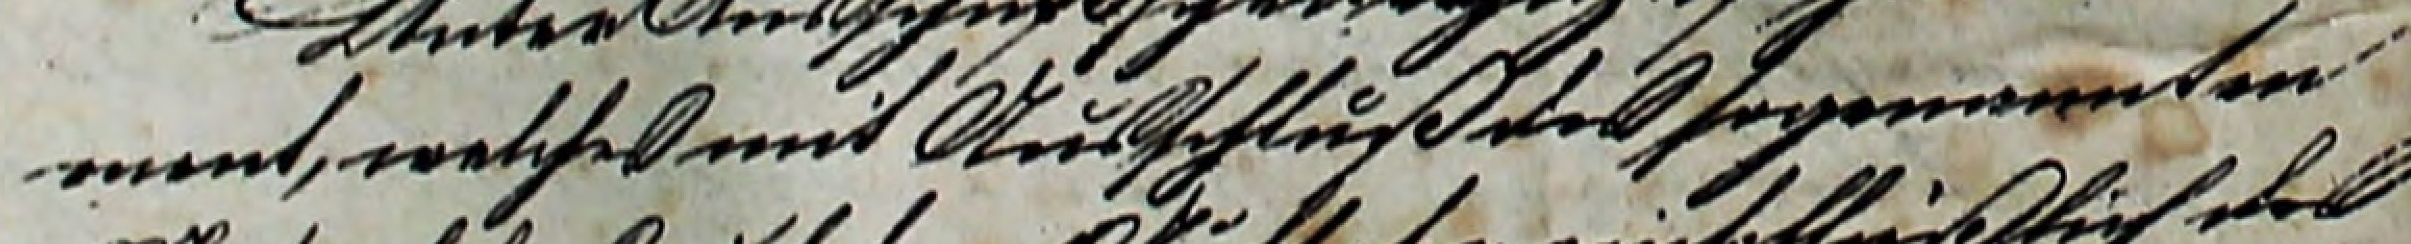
mentm welches mit Ausschluß des sogenannten
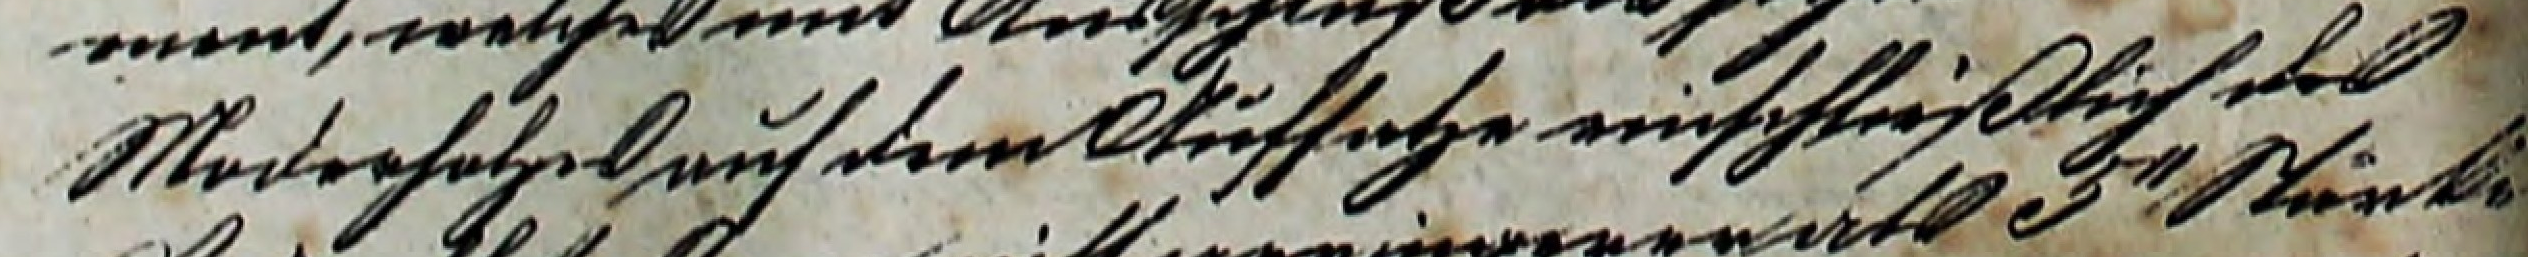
Moderholzes auf dem Aussatze einschüßlich des
